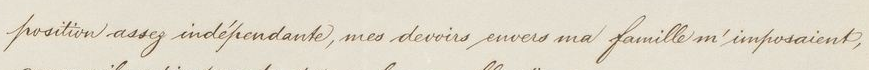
position assez indépendante, mes devoirs envers ma famille m'imposaient,
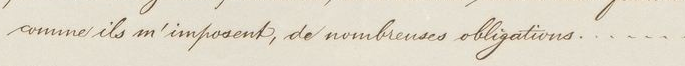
comme ils m'imposent, de nombreuses obligations...
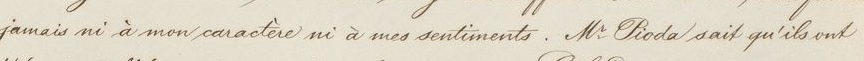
jamais ni à mon caractère ni à mes sentiments. MrPioda sait qu'ils ont
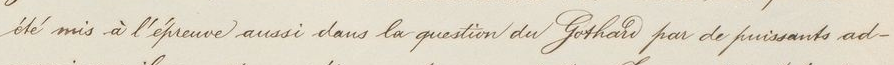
été mis à l'épreuve aussi dans la question du Gothard par de puissants ad-
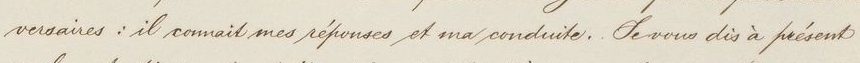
versaires: il connait mes réponses et ma conduite. Je vous dis à présent
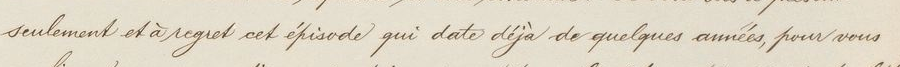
seulement et à regret cet épisode qui date déjà de quelques années, pour vous
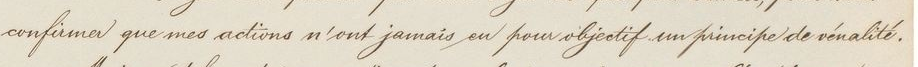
confirmer que mes actions n'ont jamais eu pour objectif un principe de vénalité.
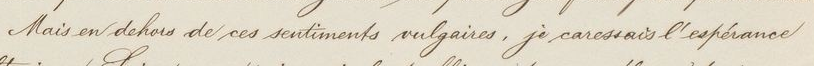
Mais en dehors de ces sentiments vulgaires, je caressais l'espérance
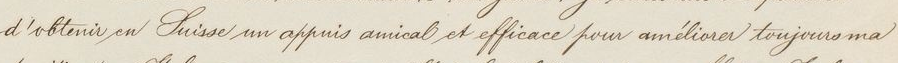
d'obtenir en Suisse un appuis amical et efficace pour améliorer toujours ma
